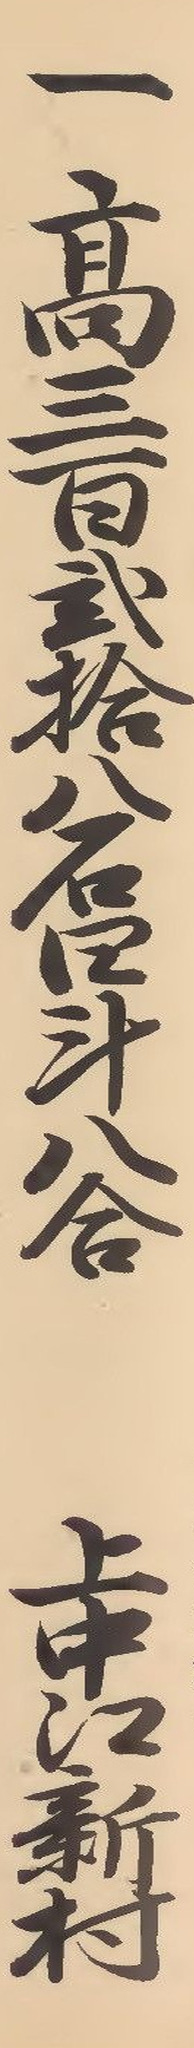一高三百弐拾八石四斗八合上中江新村
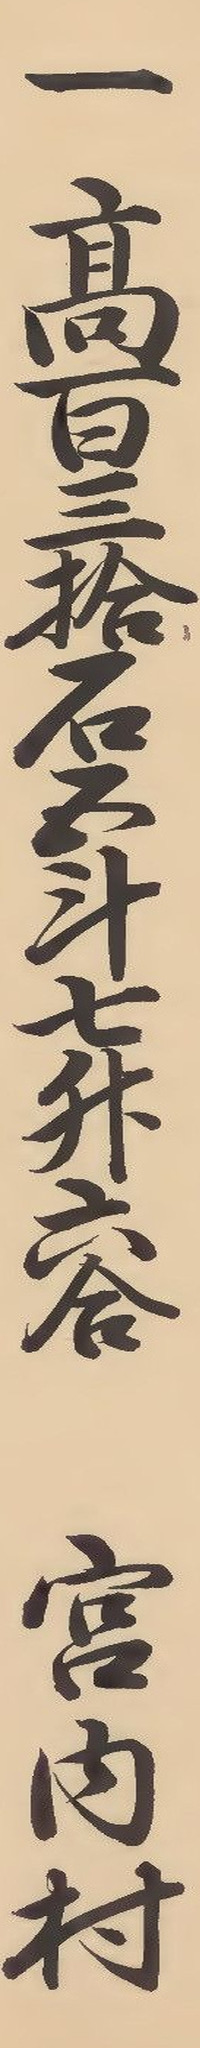一高百三拾石五斗七升六合宮内村
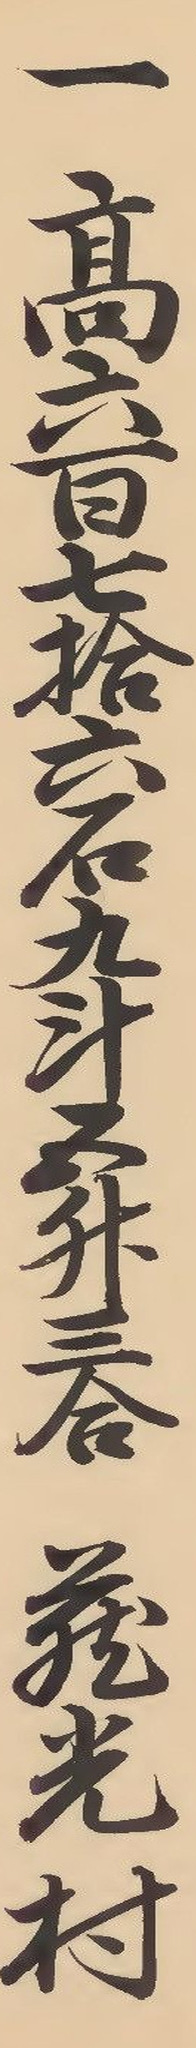一高六百七拾六石九斗五升三合蔵光村
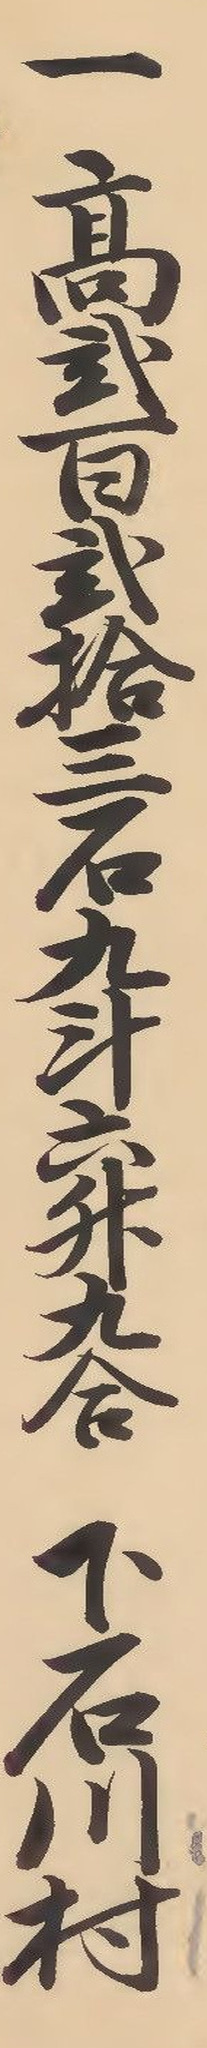一高弐百弐拾三石九斗六升九合下石川村

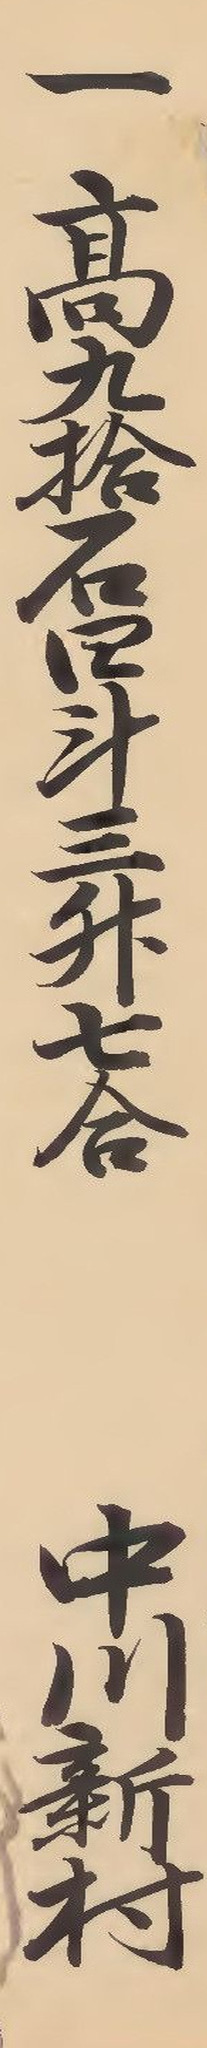一高九拾石四斗三升七合中川新村
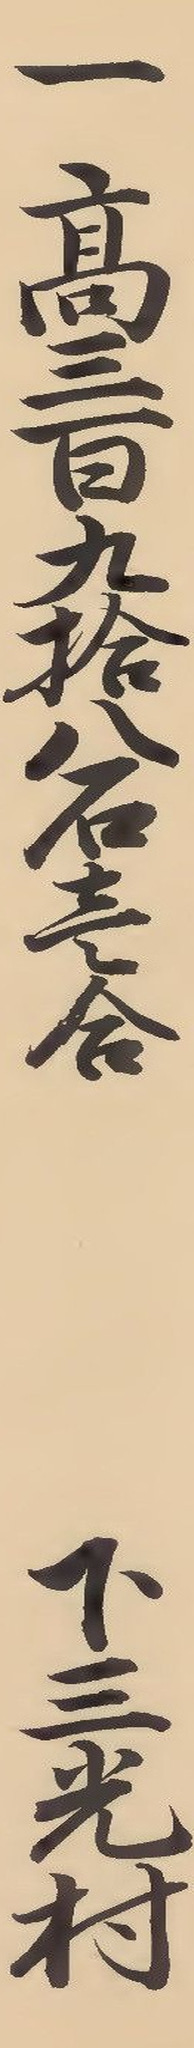一高三百九拾八石壱合下三光村
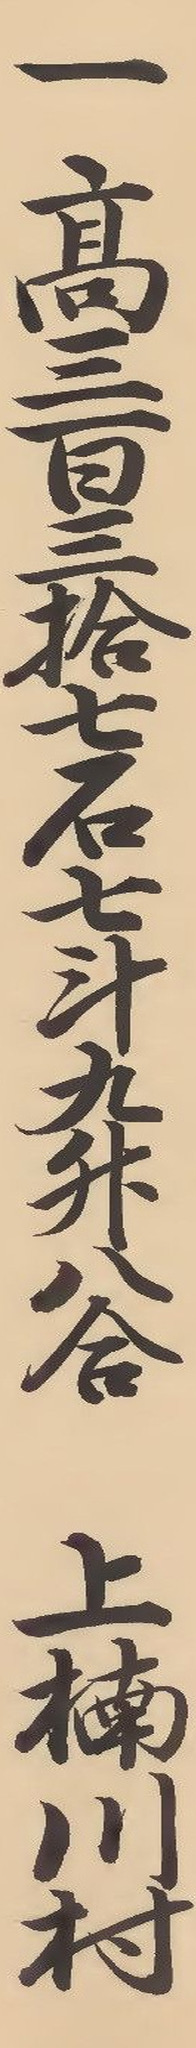一高三百三拾七石七斗九升八合上楠川村
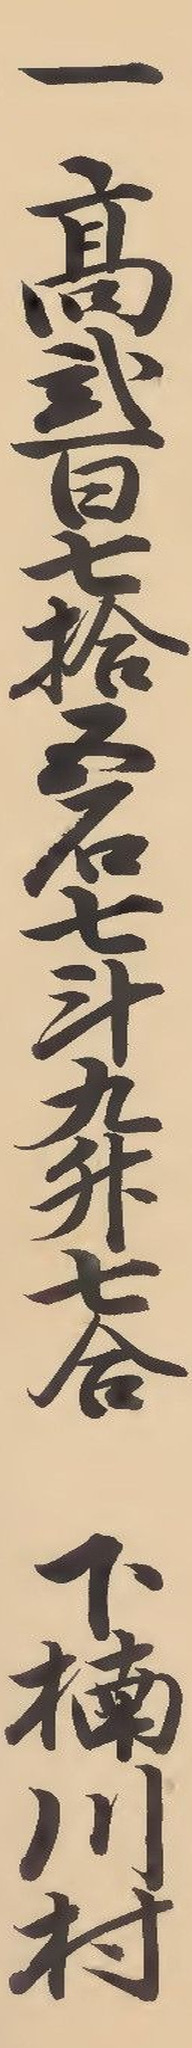一高弐百七拾五石七斗九升七合下楠川村
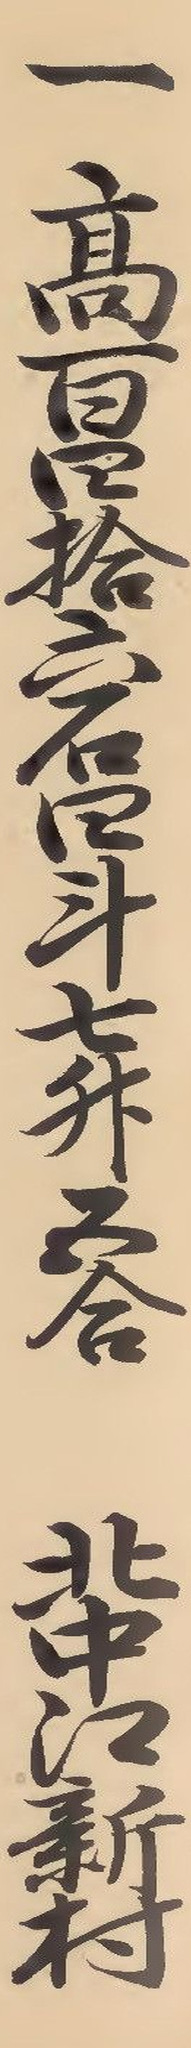一高百四拾六石四斗七升五合北中江新村
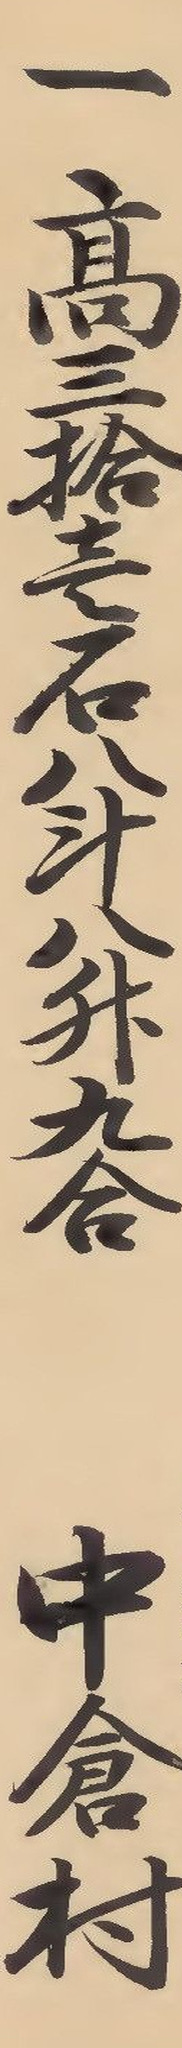一高三拾壱石八斗八升九合中倉村
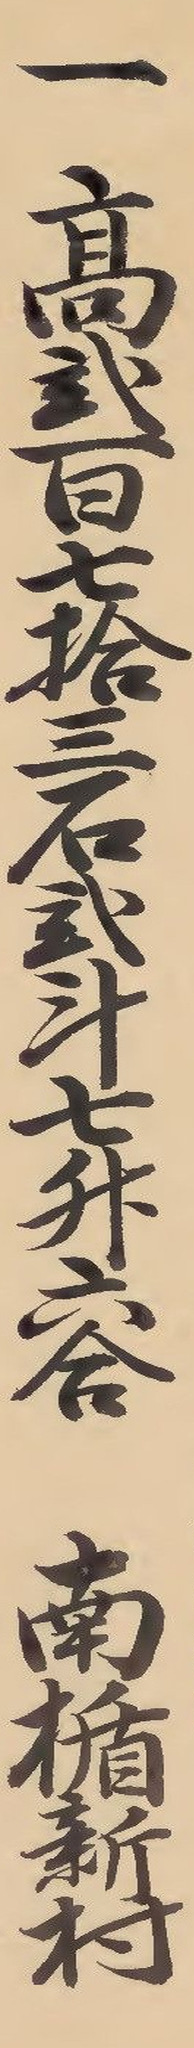一高弐百七拾三石弐斗七升六合南楯新村
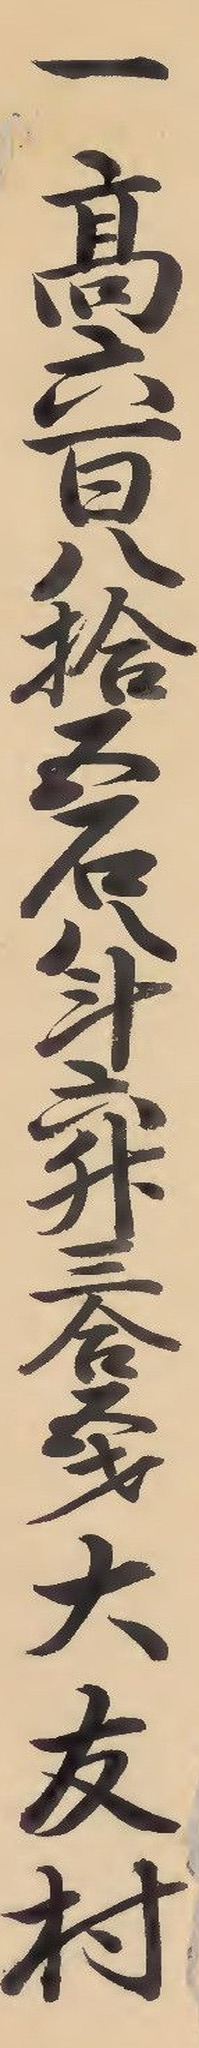一高六百八拾五石八斗六升三合五才大友村

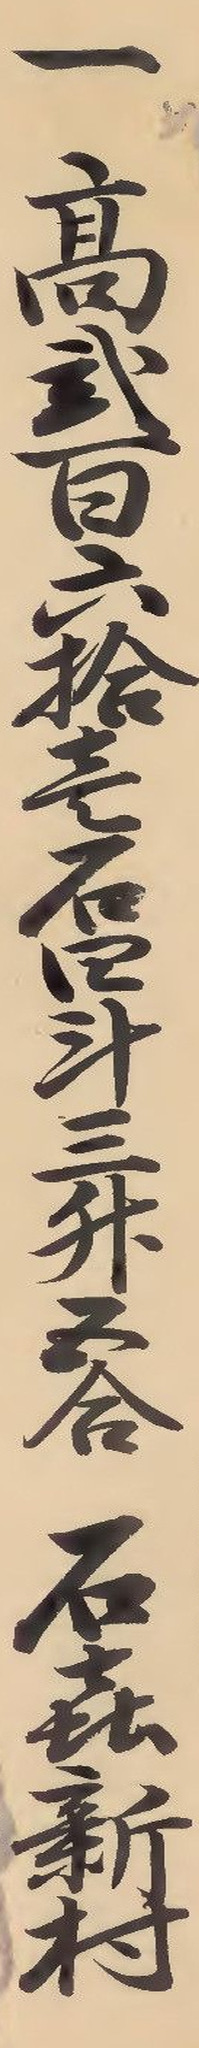一高弐百六拾壱石四斗三升五合石喜新村
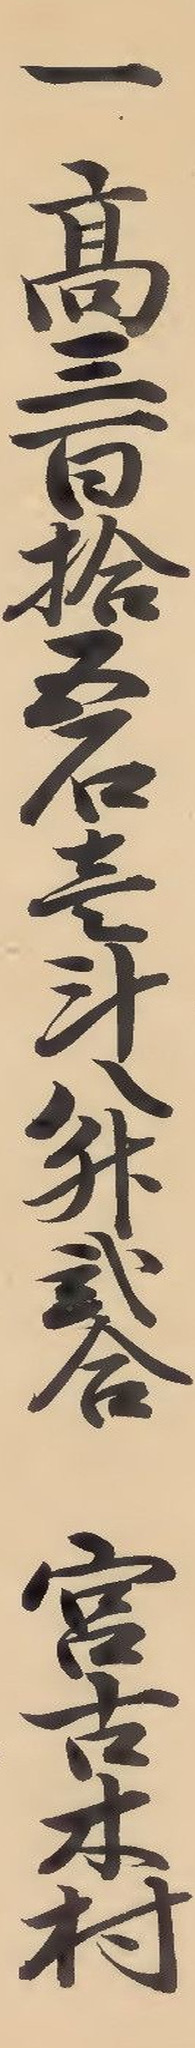一高三百拾五石壱斗八升弐合宮古木村
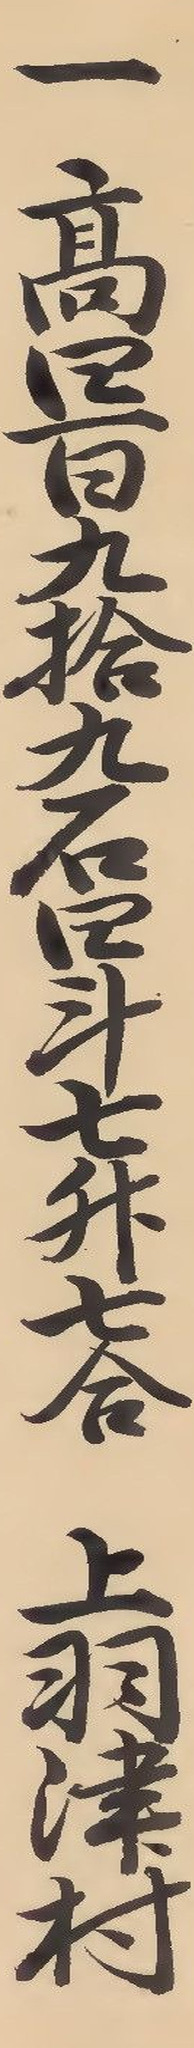一高四百九拾九石四斗七升七合上羽津村
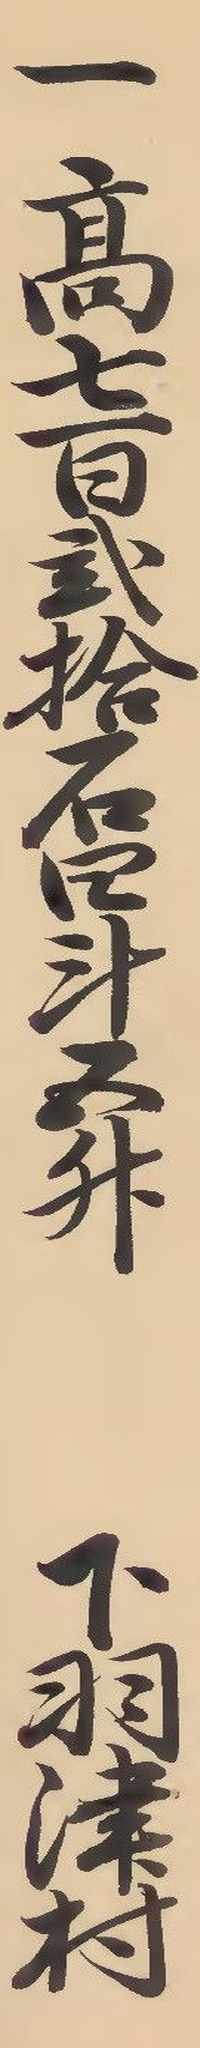一高七百弐拾石四斗五升下羽津村
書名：越後国郷帳　下
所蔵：国立公文書館 National Archives of Japan
